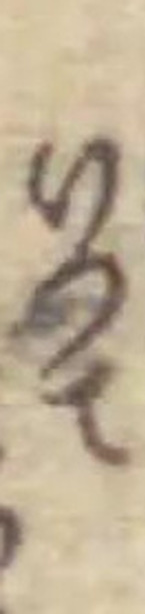いつて
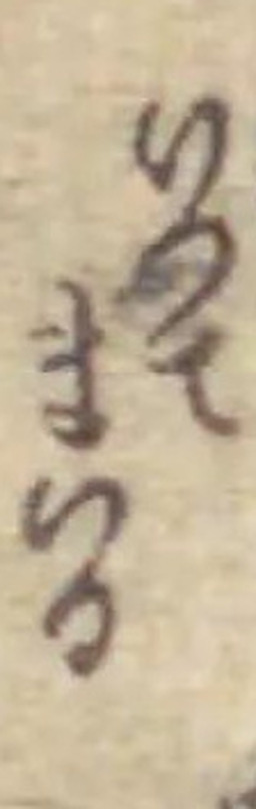まいる
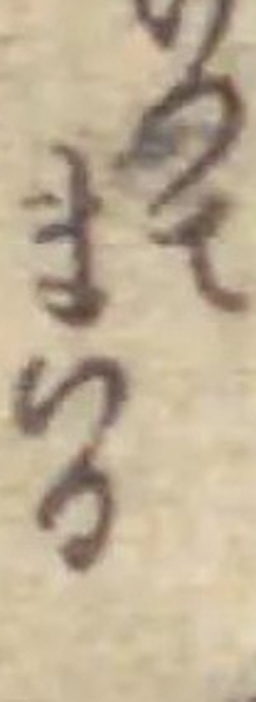まいる
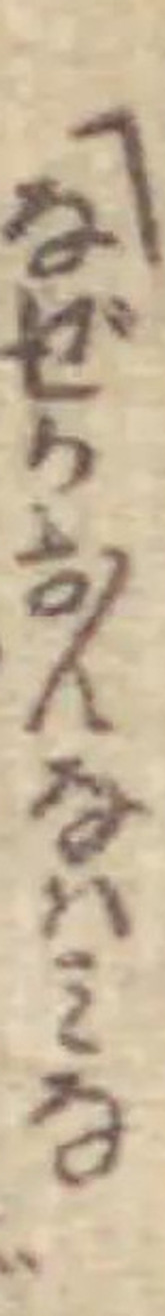〽なぜかおんなはみな
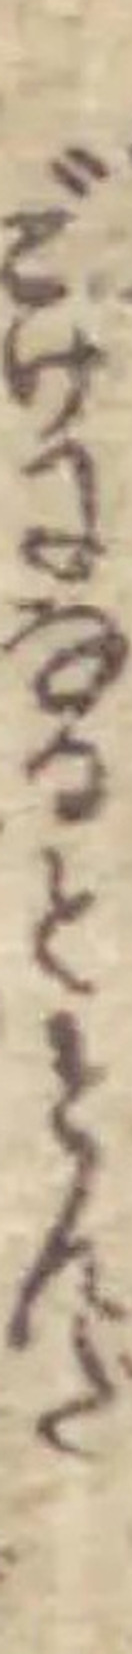ごけになるととんだ
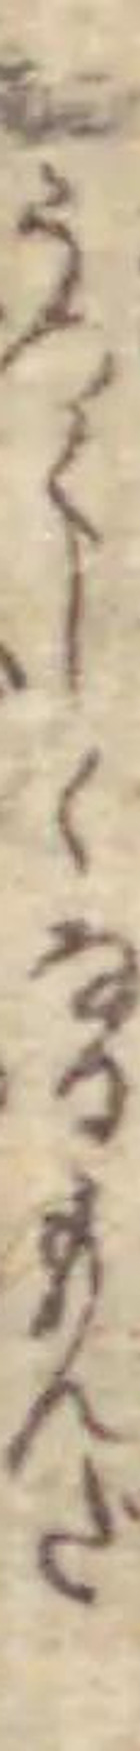うつくしくなるもんだ
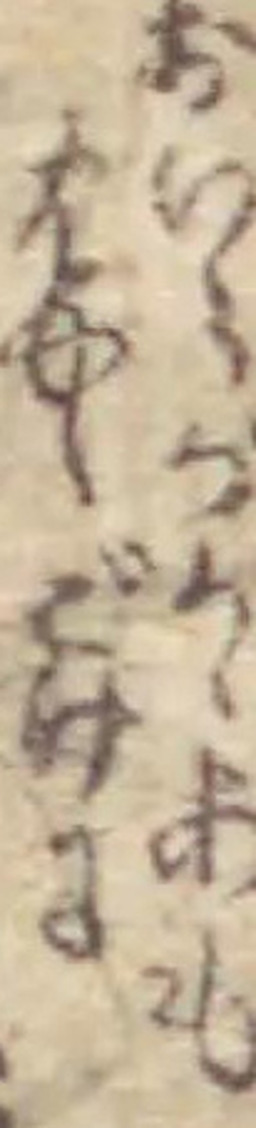はやくごけに
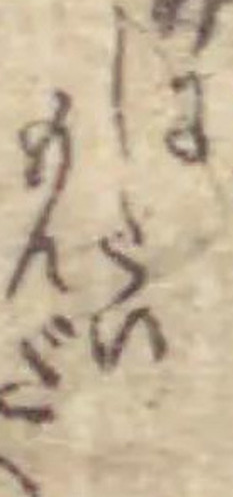もんだ
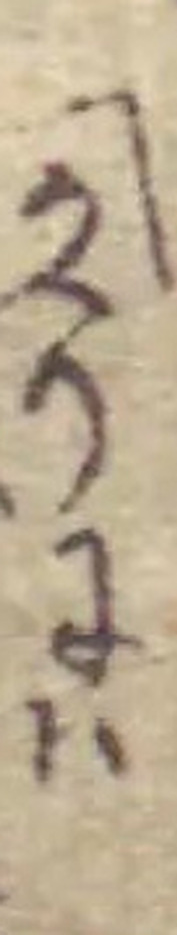〽かへりには
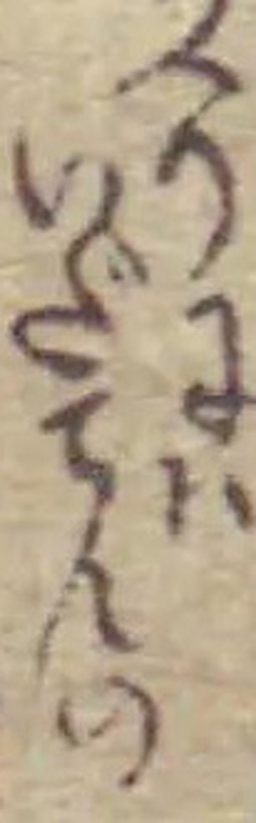いだてんの
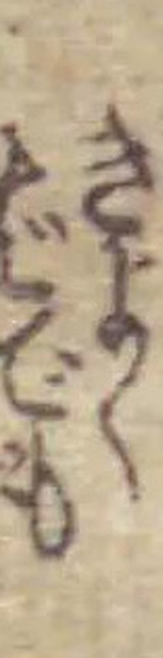ばでも
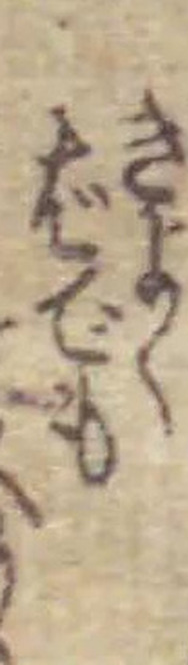ばでも
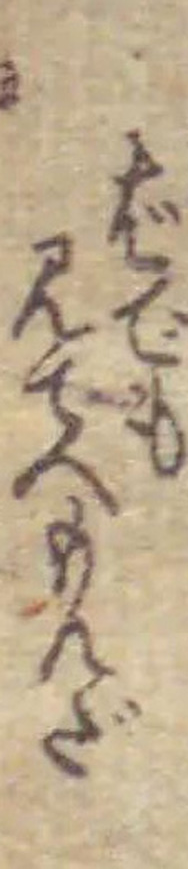見てへもんだ
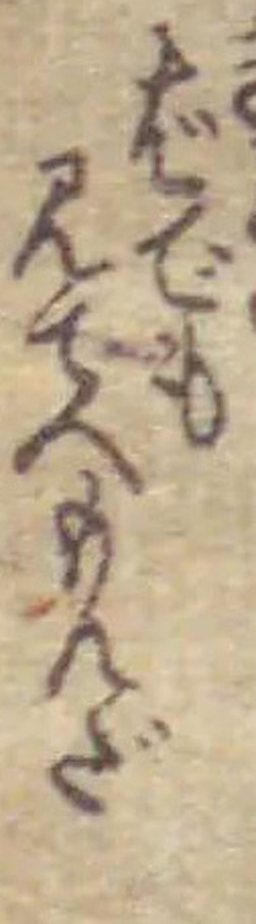見てへもんだ

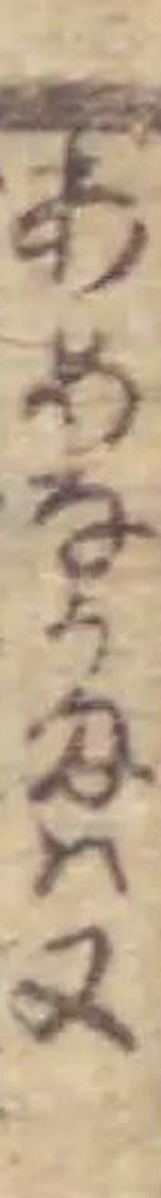あめなかまは又
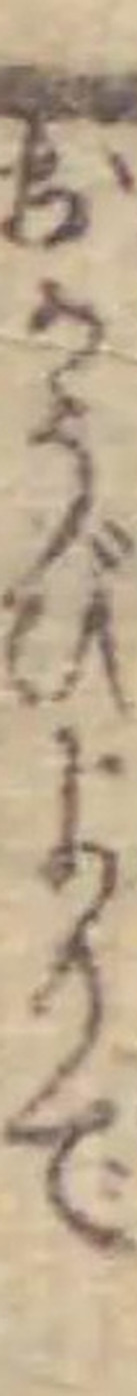おかうびよりで
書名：雨宮風宮出儘略縁記 3巻
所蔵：国立国会図書館 National Diet Library, JAPAN
